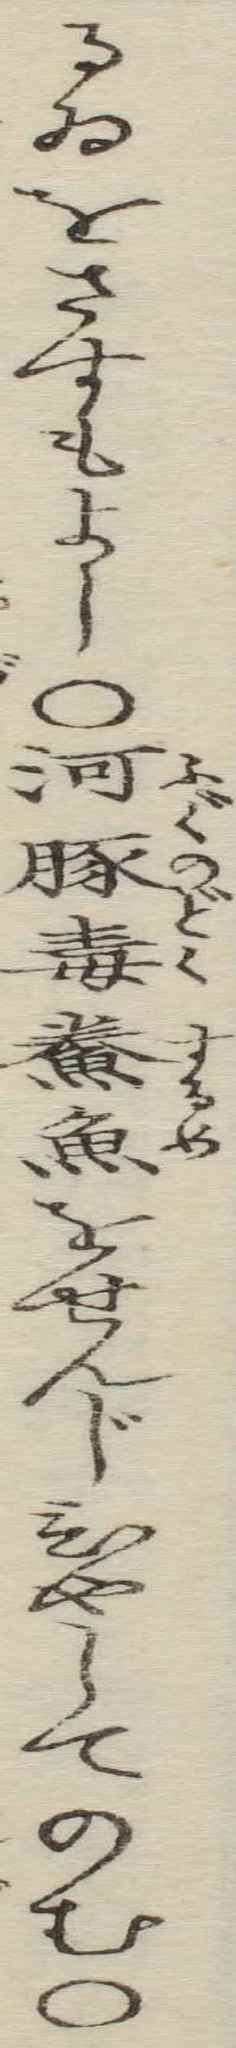るゐをさすもよし○河豚毒鮝魚をせんじひやしてのむ○
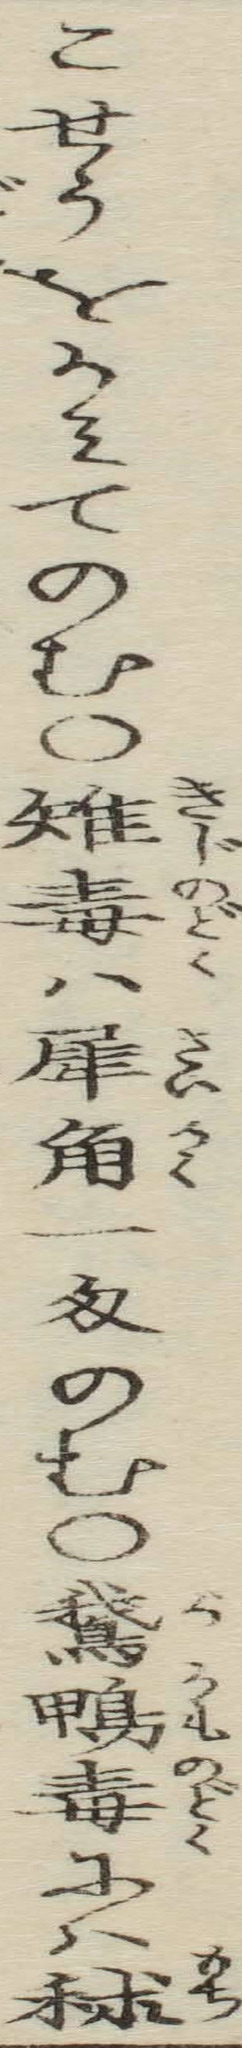こせうをかみてのむ○雉毒は犀角一匁のむ○鵞鴨毒には秫
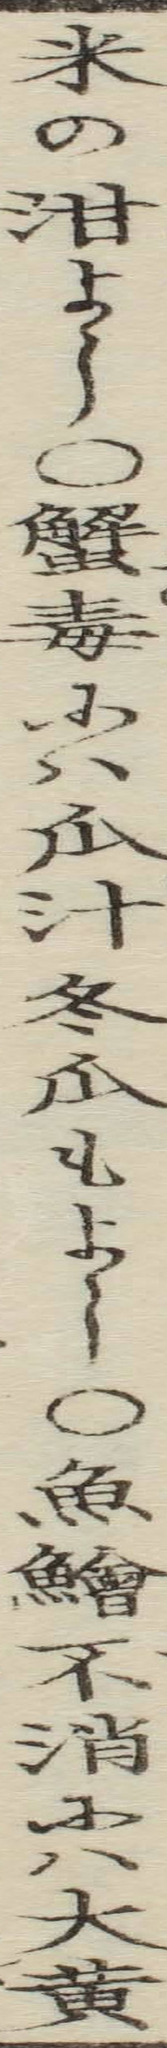米の泔よし○蟹毒には瓜汁冬瓜もよし○魚鱠不消には大黄
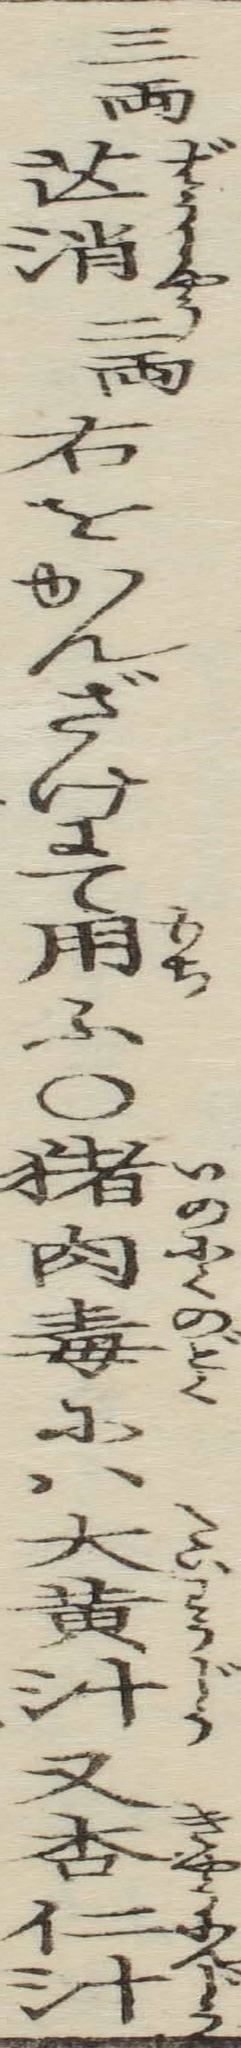三両芒消二両右をかんざけにて用ふ○猪肉毒には大黄汁又杏仁汁
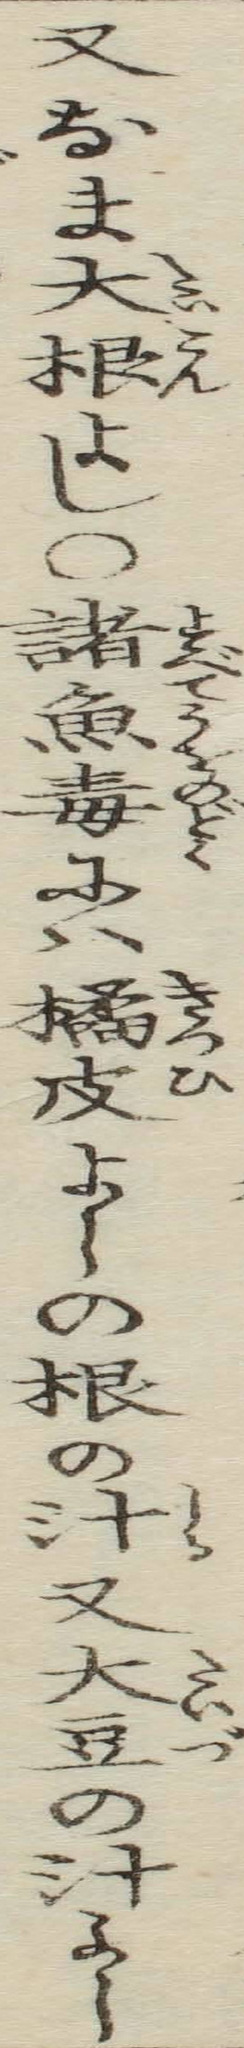又なま大根よし○諸魚毒には橘皮よしの根の汁又大豆の汁よし
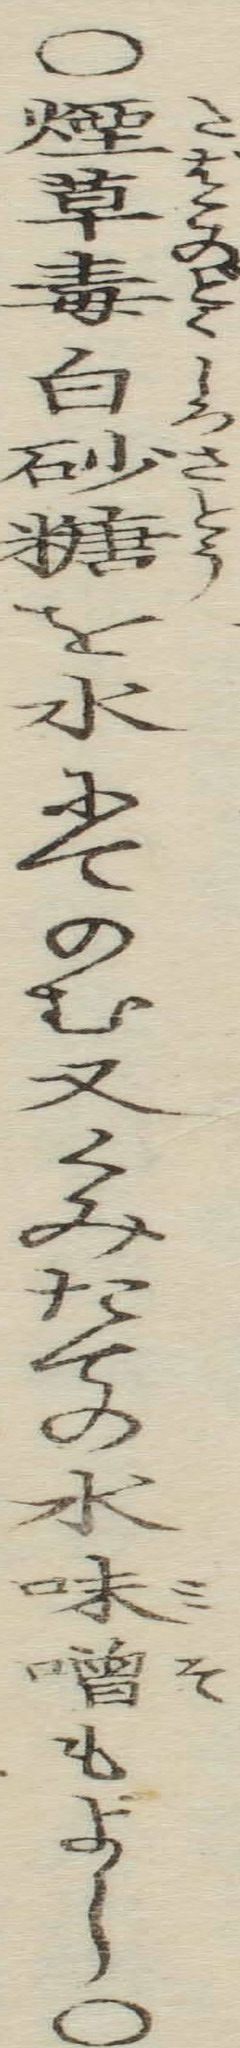○煙草毒白砂糖を水にてのむ又くみたての水味噌もよし○
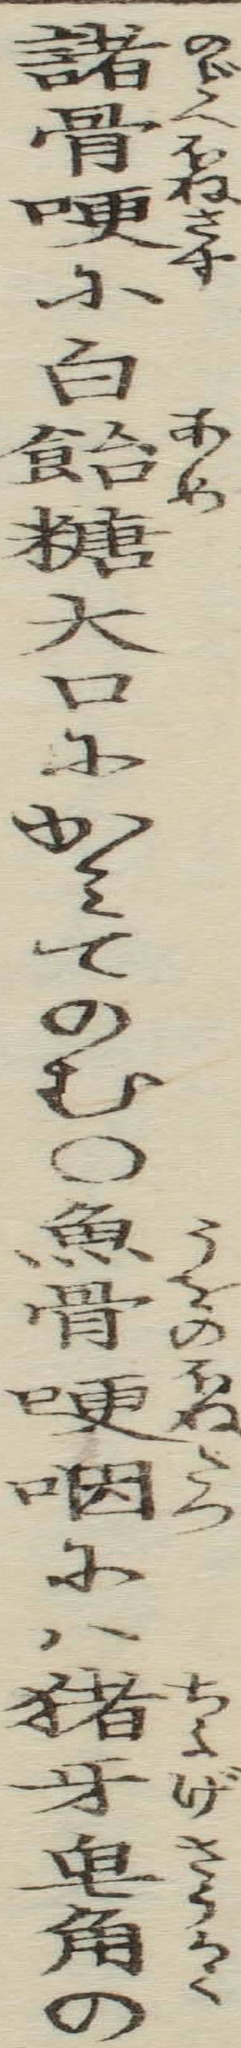諸骨硬に白飴糖大口にかみてのむ○魚骨硬咽には猪牙皂角の

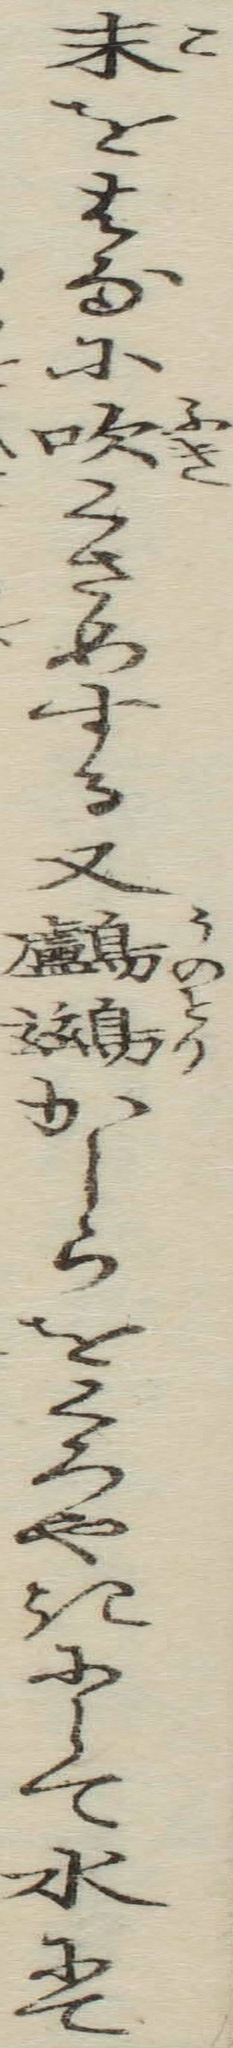末をはなに吹くさめする又鸕鷀かしらをくろやきにして水にて
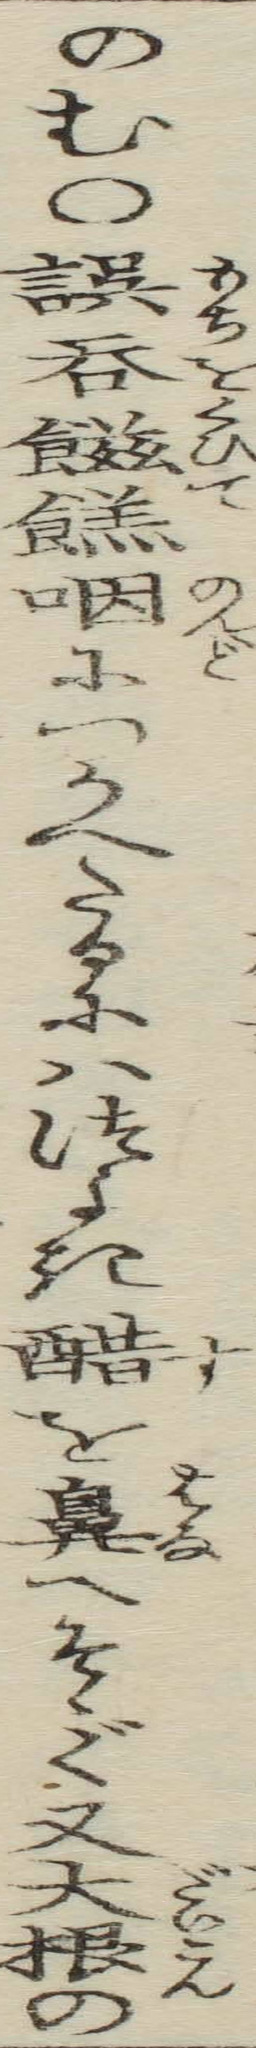のむ○誤呑餻咽につかへたるにはつよき醋を鼻へそゝぐ又大根の
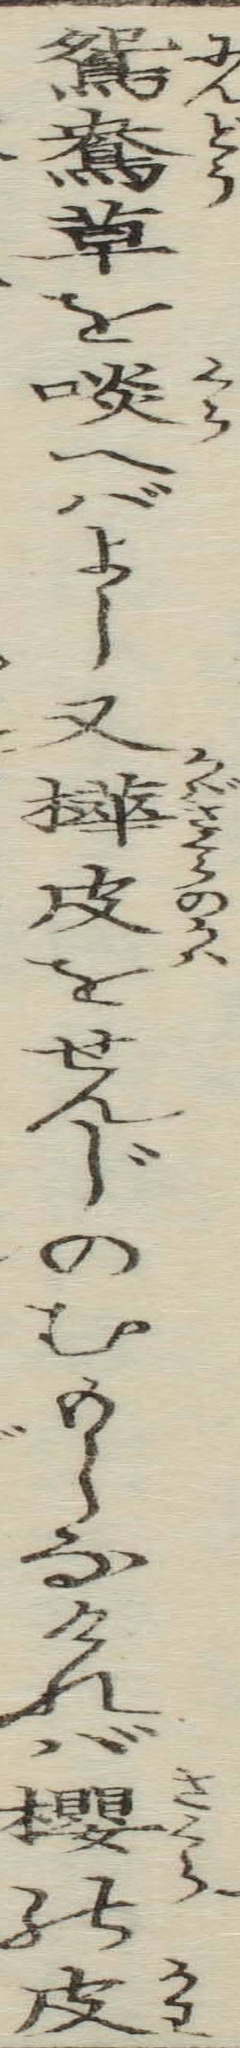鴛鴦草を啖へばよし又樺皮をせんじのむもしなければ桜の皮
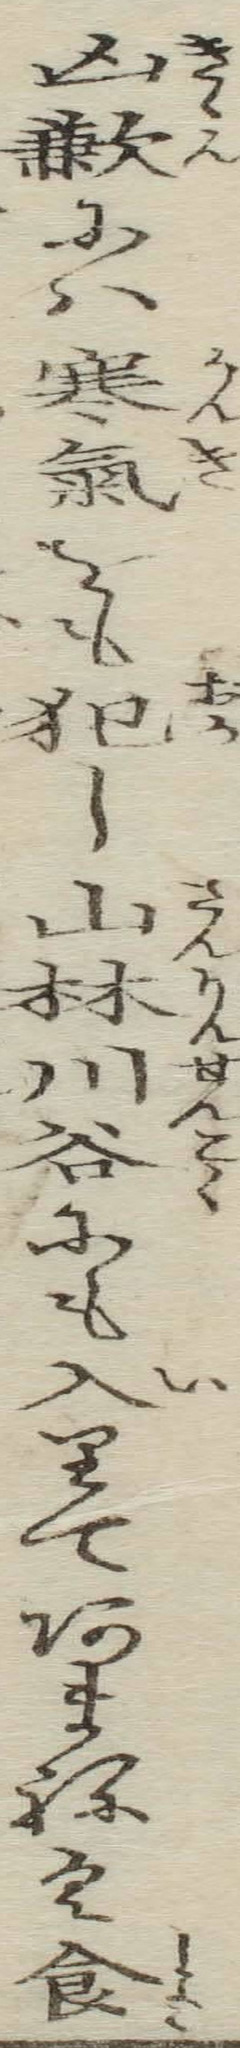凶歉には寒気をも犯し山林川谷にも入りてあまねく食
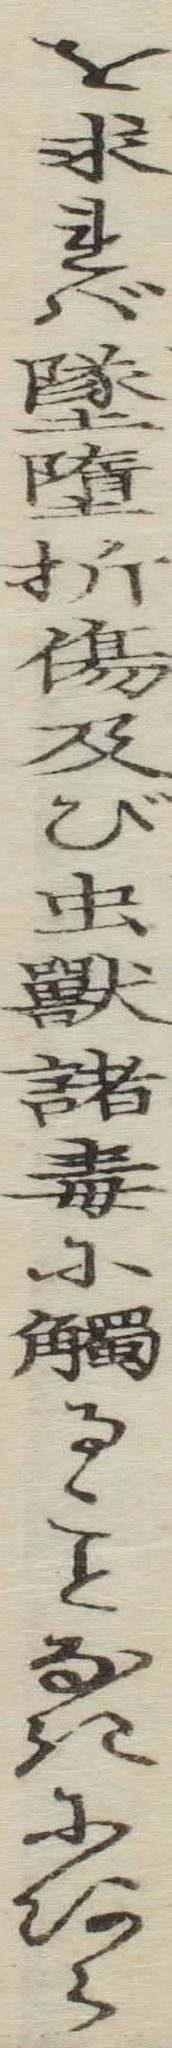を求れば墜墮折傷及び虫獣毒に触ることなきにあら
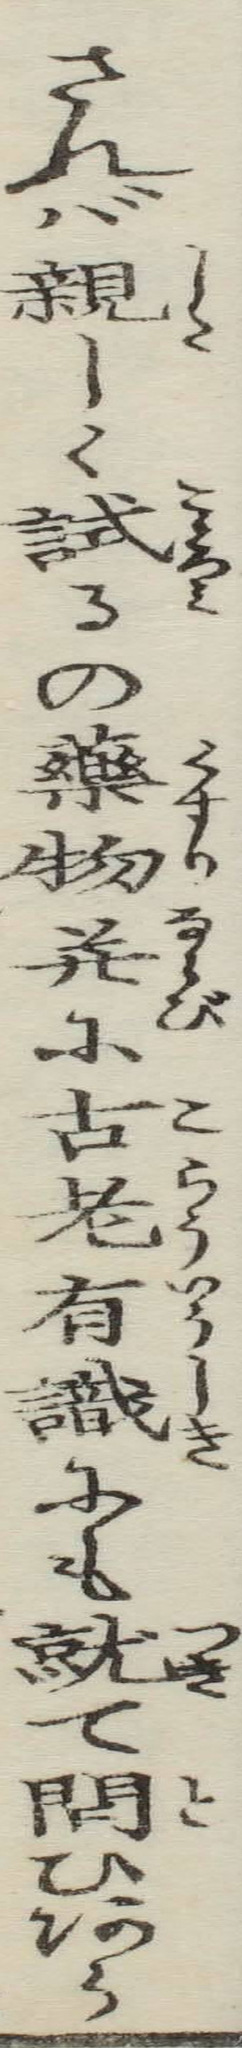されば親しく試るの薬物并に古老有識にも就て問ひあら
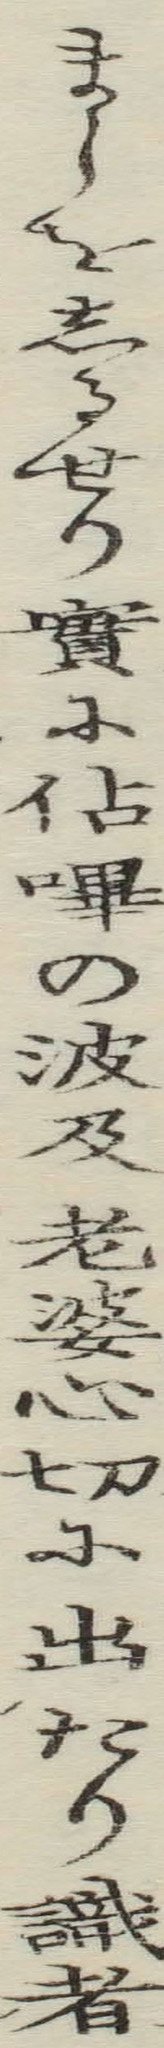ましをしるせり實に佔嗶の波及老婆心切に出たり識者
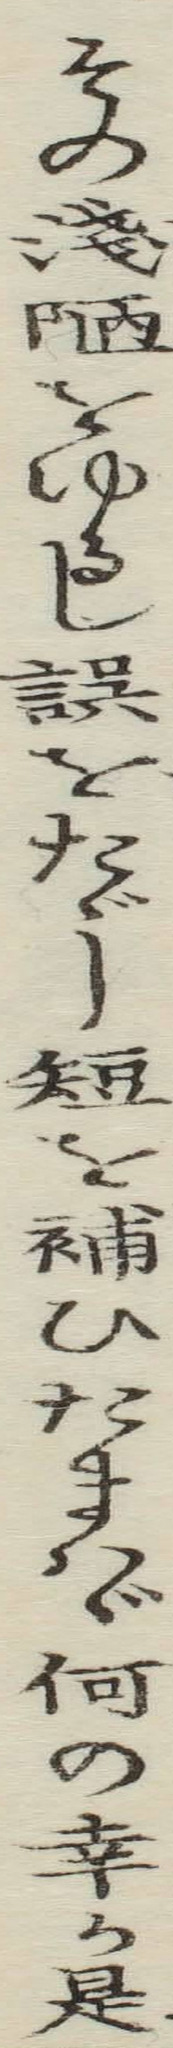その浅陋をゆるし誤をたゞし短を補ひたまはゞ何の幸か是
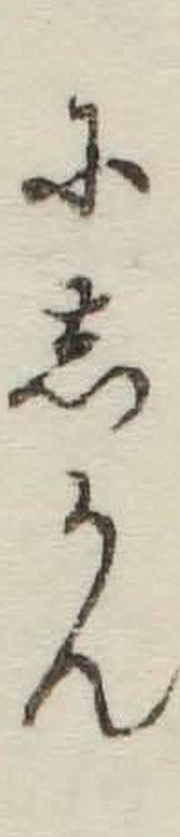にしかん
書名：救荒便覧
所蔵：国文学研究資料館
